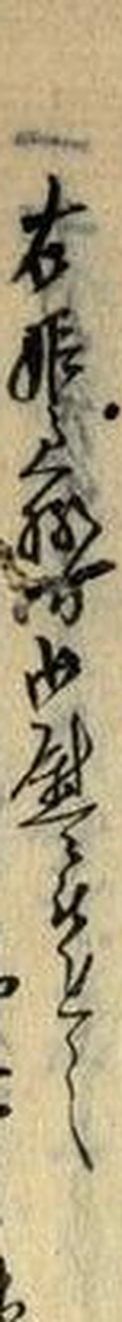右姫君様ゟ御慰ニ被進之
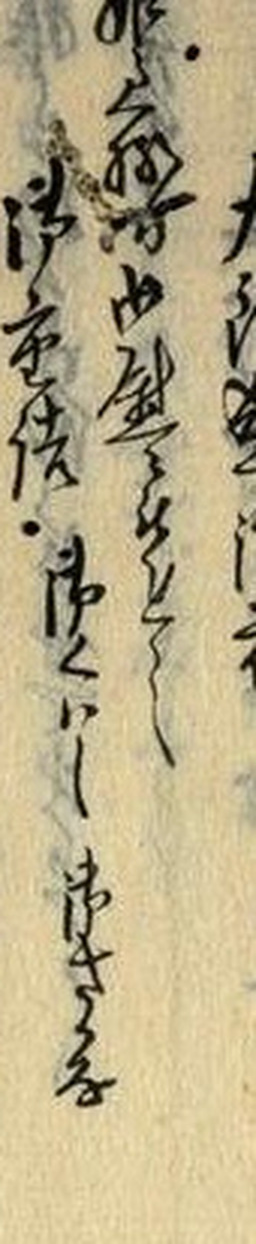御重詰御くハし御さかな
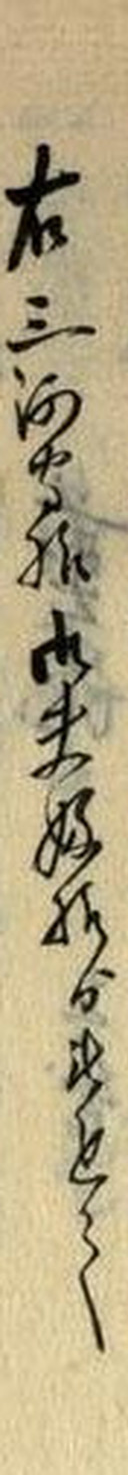右三河守様御夫婦様ゟ被進之
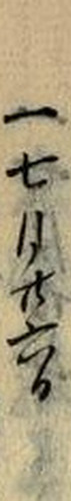一七月廿六日
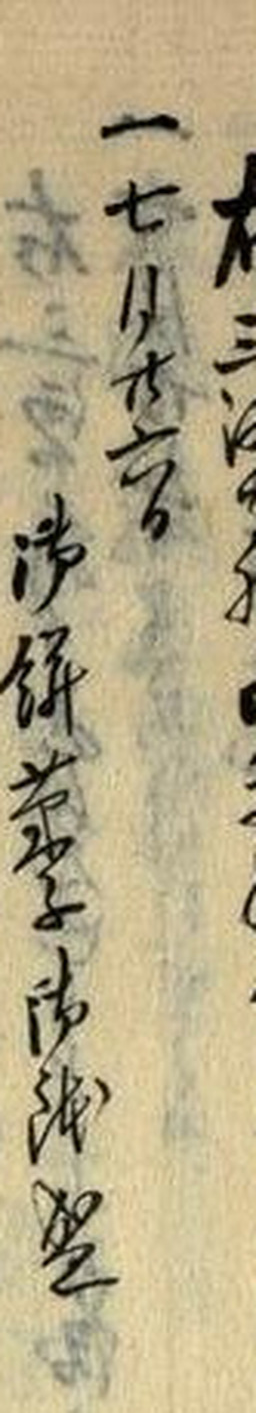御餅菓子御鉢盛
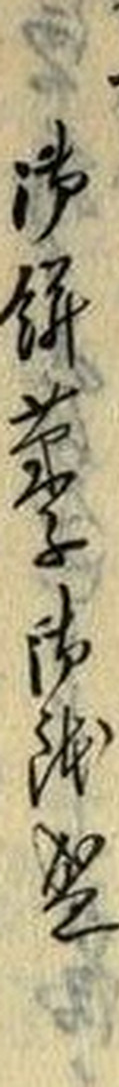御餅菓子御鉢盛
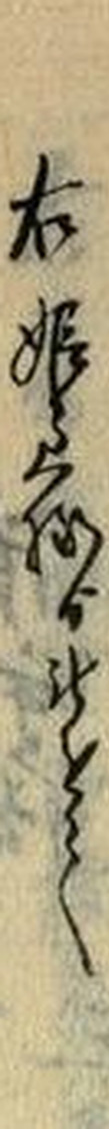右姫君様ゟ被進之
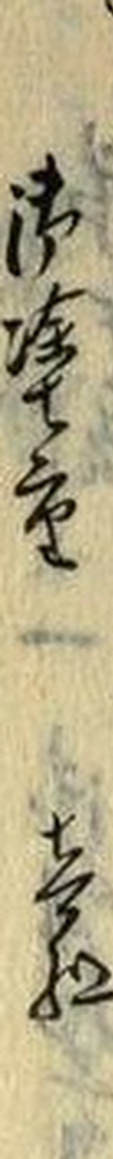御塗重壱組
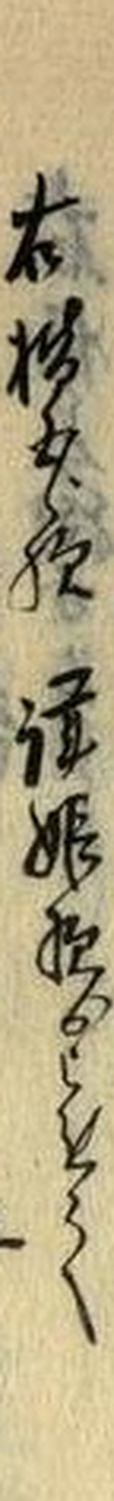右楷五郎様謹姫様ゟ被進之
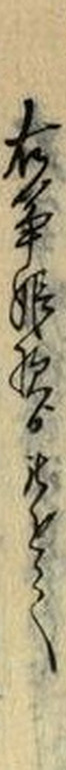右箏姫様ゟ被進之
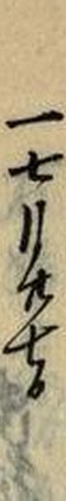一七月廿七日
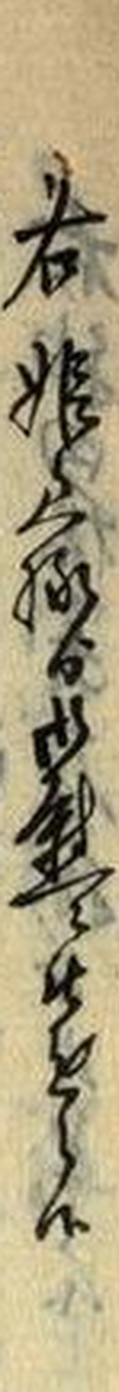右姫君様ゟ御慰ニ被進之候
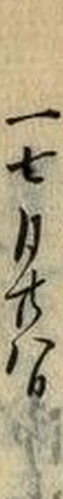一七月廿八日
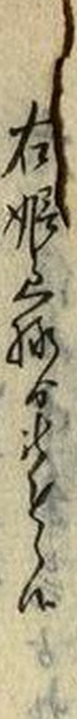右姫君様ゟ被進之候
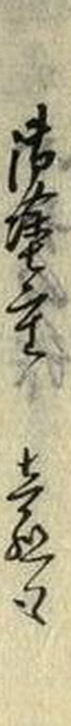御塗重壱組ツヽ
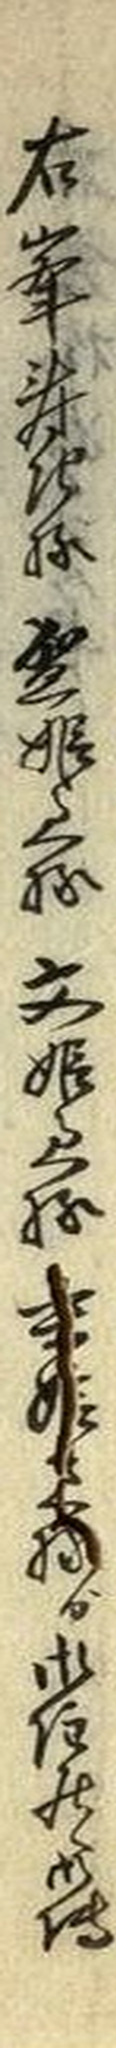右峯寿院様盛姫君様文姫君様末姫君様ゟ御住居御伝
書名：少傅日録抄（斉承付側向頭取日記、在府）
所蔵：福井県文書館 Fukui Prefectural Archives
